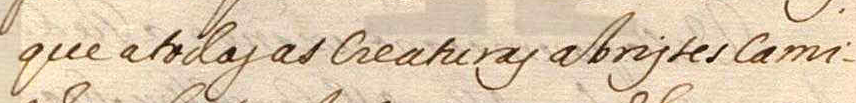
que a todas as creaturas abristes cami
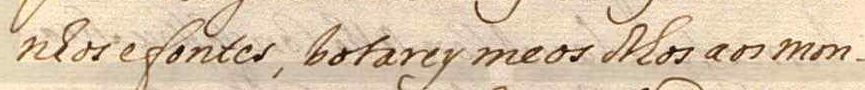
nhos e fontes, botarey meos olhos aos mon
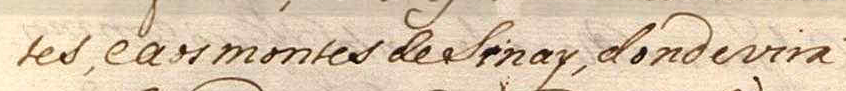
tes, e aos montes de Sinay, donde virá
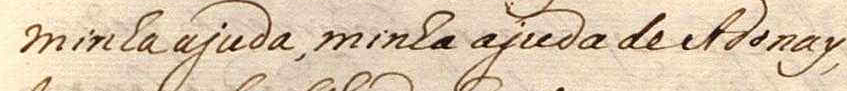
minha ajuda, minha ajuda de Adonay,
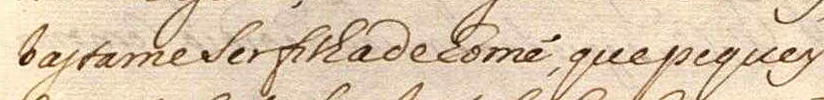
bastame ser filha de homē, que pequey
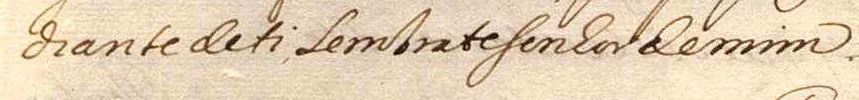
diante de ti, Lembrate senhor de mim.
